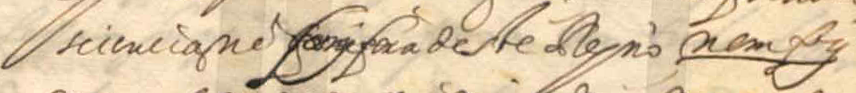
sciencia nē foy fora deste Reyno nem foy
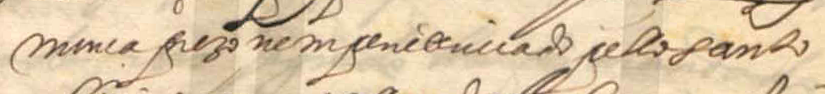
nunca prezo nem penètenciado pello santo
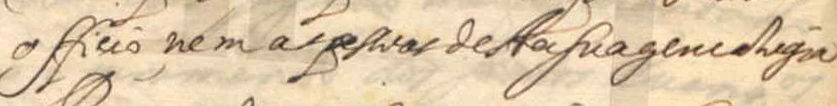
officio nem as pessoas desta sua genealogia
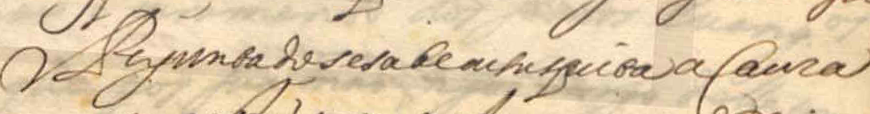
Perguntado se sabe ou suspeita a Cauza
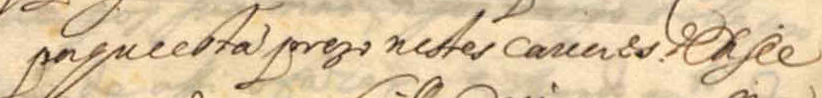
por que està prezo nestes carceres e disse
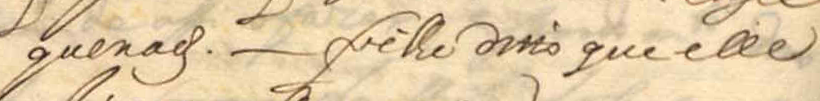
que naõ. - foi lhe ditto que elle
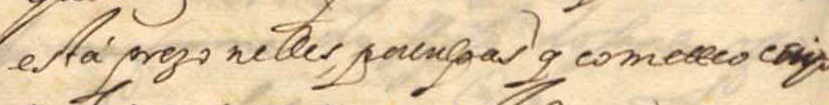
está prezo nelles, por culpas q̄ cometteo cujo
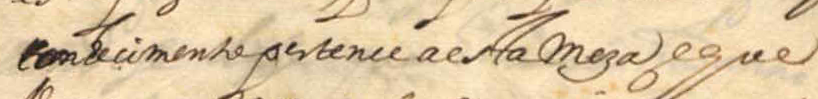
conhecimento pertence a esta meza, e que
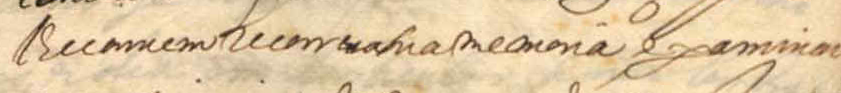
lhe conuem recorrer a sua memoria examinou
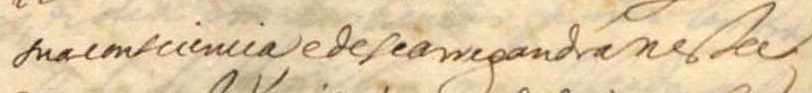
sua consciencia, e descarregandra nesta
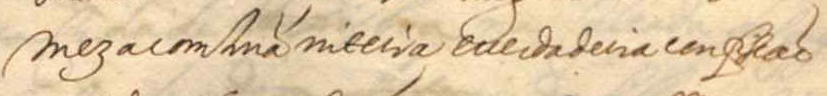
meza com huā inteira e uerdadeira confissaõ
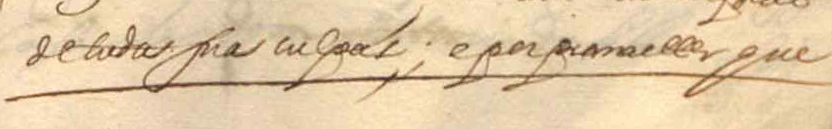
de tudas suas culpas; e por prometter que
